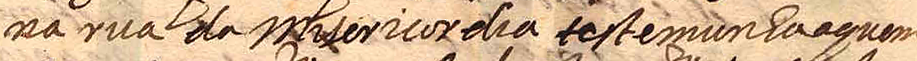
na rua da misericordia testemunha a quem
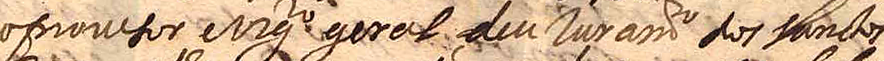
o prouisor e vigro. geral, deu Iuramto dos sanctos
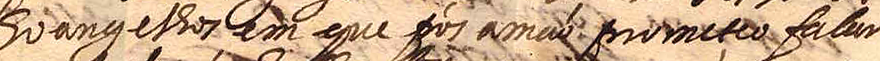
Evangelhos em que pos a maõ prometeo falar
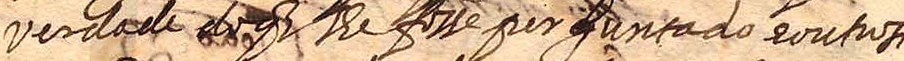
verdade do q̄ lhe fosse perguntado E outrosi
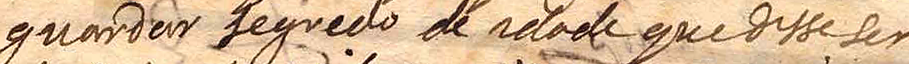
guardar segredo de idade que disse ser
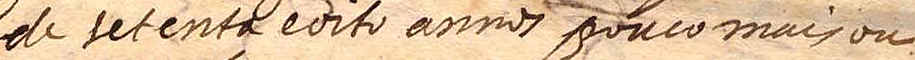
de setenta e oito annos pouco mais ou
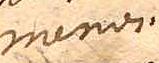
menos.
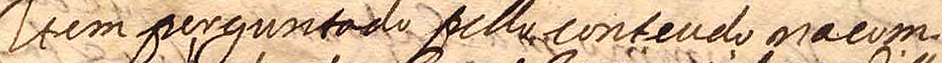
Item perguntado pello conteudo na com
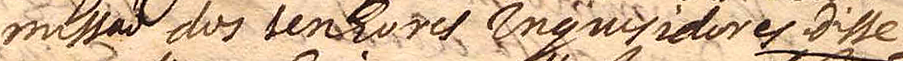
missaõ dos senhores Inquisidores disse
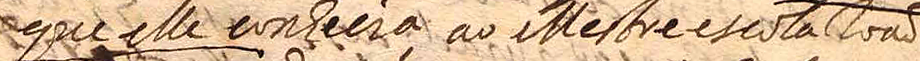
que elle conhecia ao Mestre escola Ioaõ
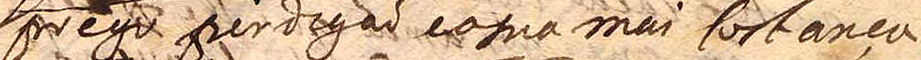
prego perdigaõ e a sua mai Costança
